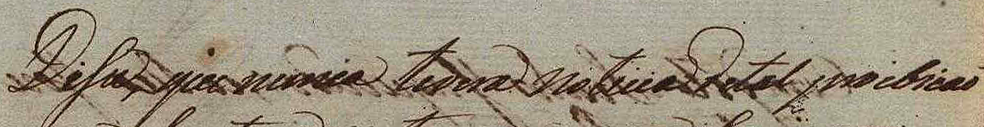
Disse que nunca tevera noticia de tal proibicaõ
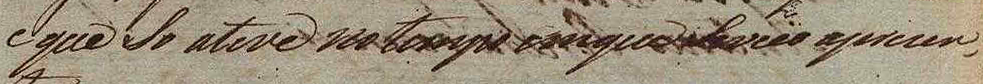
e que So a teve no tempo em que se veio aprezen
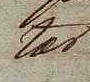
tar
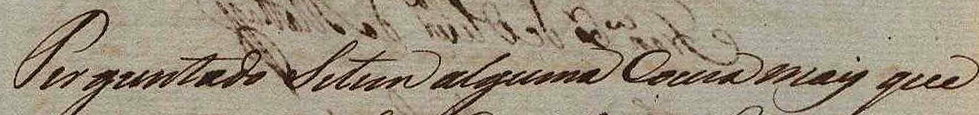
Perguntado Se tem alguma couza mais que
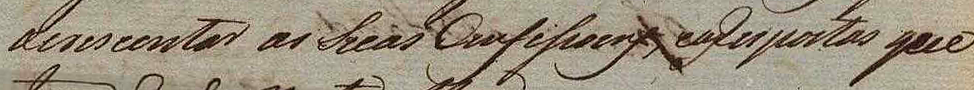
acrescentar as Suas Confissoens, e a respostas que
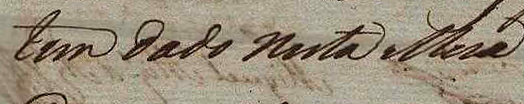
tem dado nesta Meza
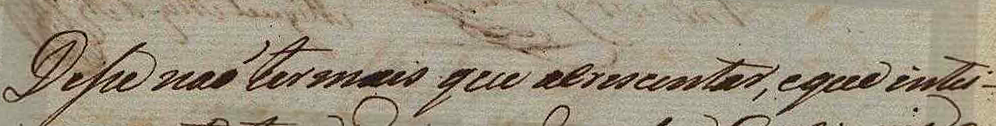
Disse naõ ter mais que acrescentar, e que intei
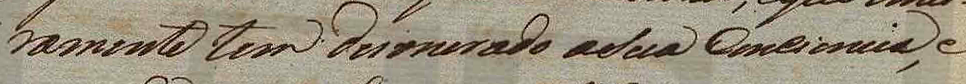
ramente tem desonerado a sua conciencia, e
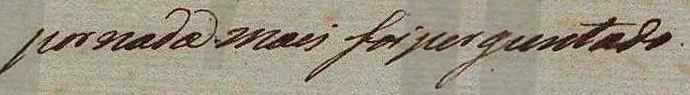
por nada mais foi perguntado.
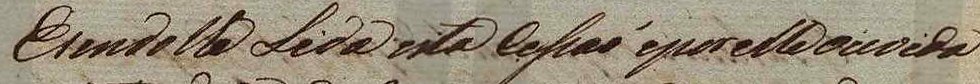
E sendolhe Lida esta Cessaõ e por elle ouvida
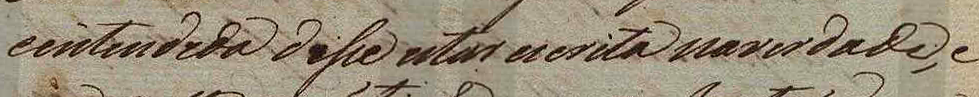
e entendida disse estar escrita na verdade, e
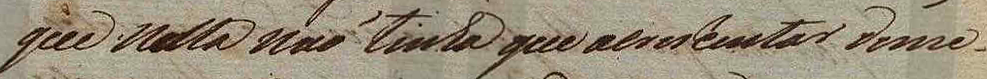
que nella naõ tinha que acrescentar deme
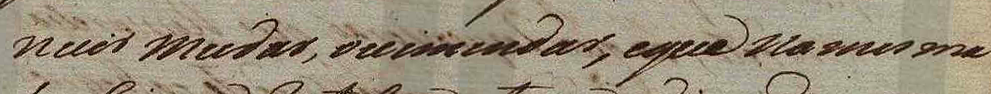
nuir mudar, ou emendar, e que na mesma
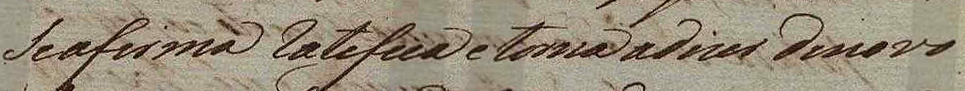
se afirma Ratefica e torna a dizer de novo
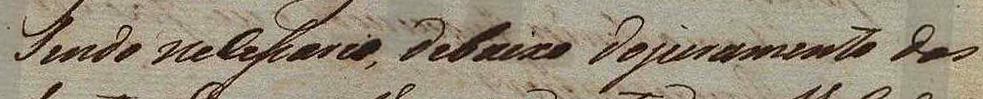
sendo necessario, debaixo do juramento dos
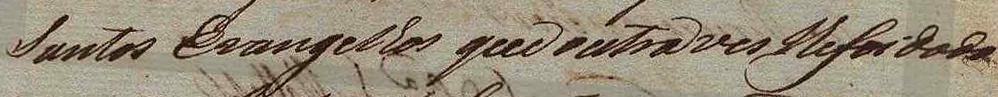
Santos Evangelhos que outra ves lhe foi dado
